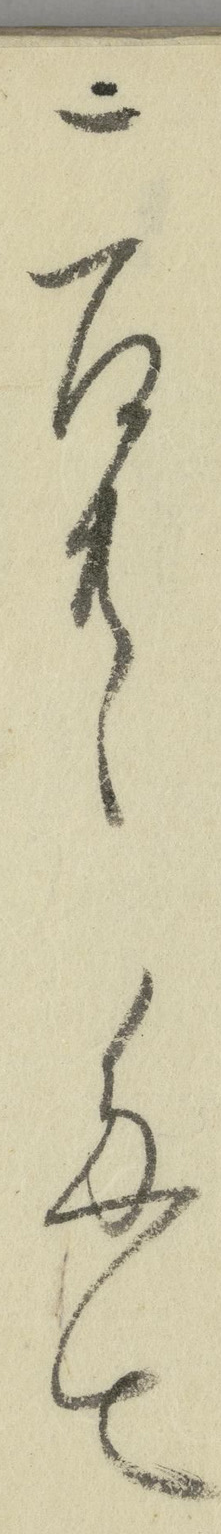一百廿文多七
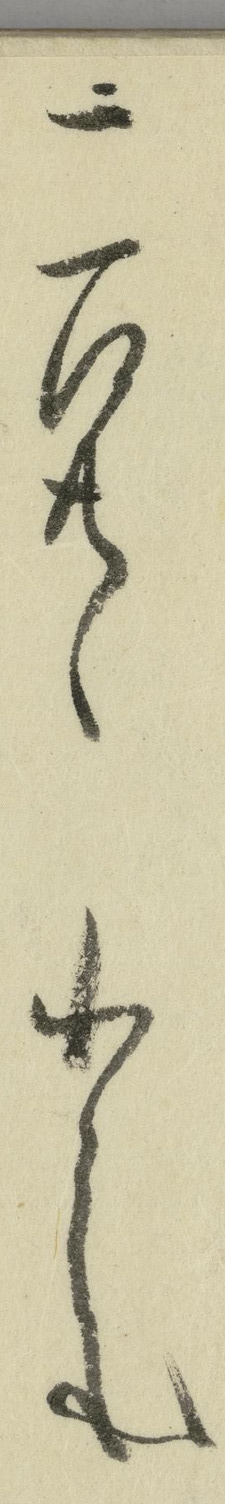一百廿文三介
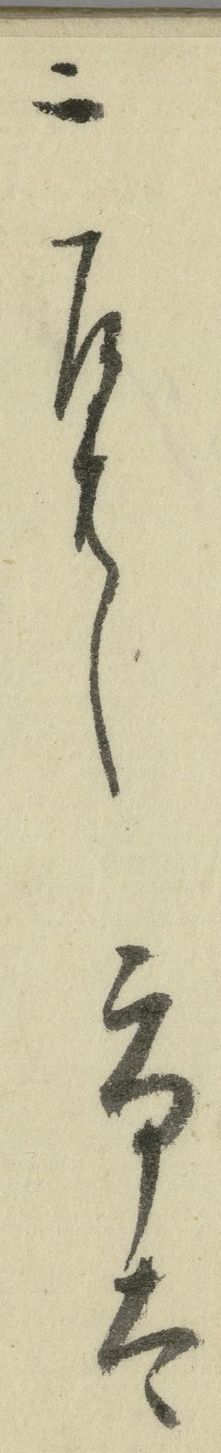一百廿文市太
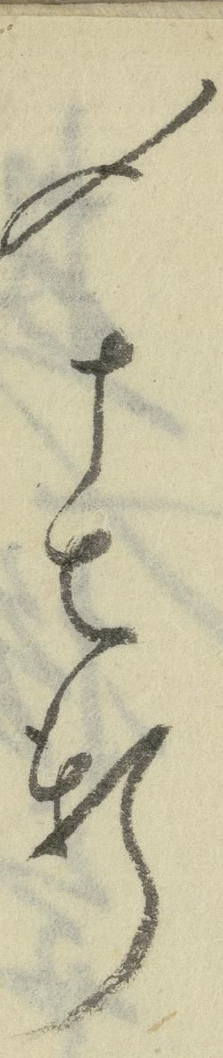〆十七軒
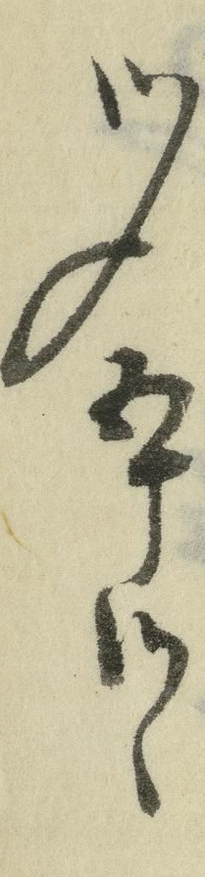弐貫五十弐文

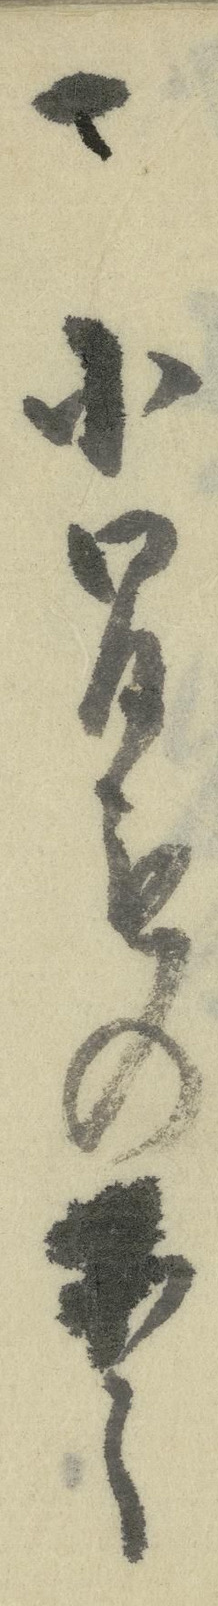一小間もの品々
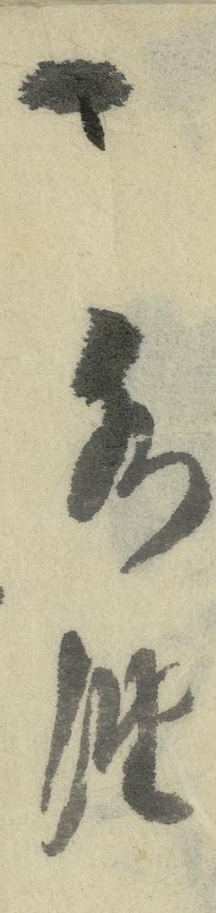一水油
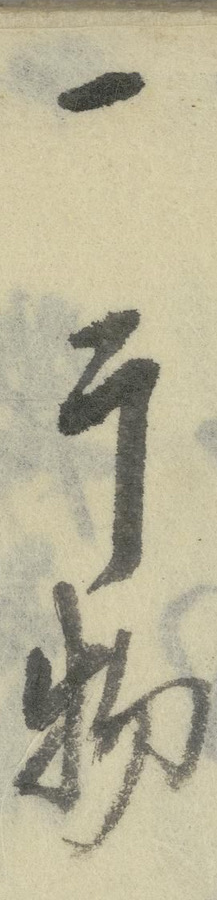一干物
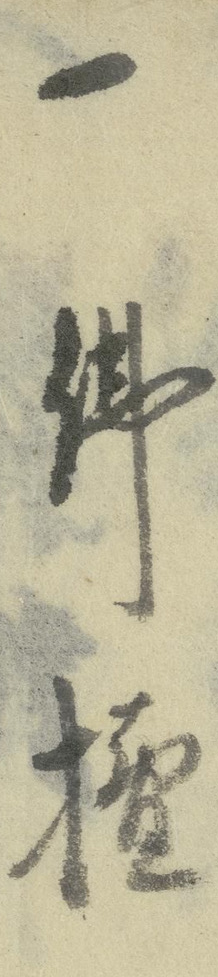一仏壇
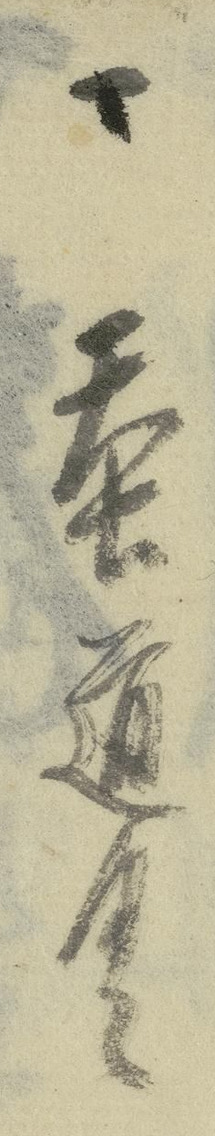一茶道具
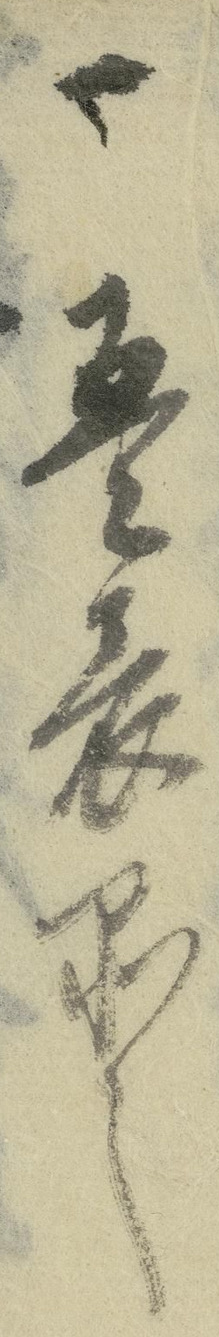一畳表品々
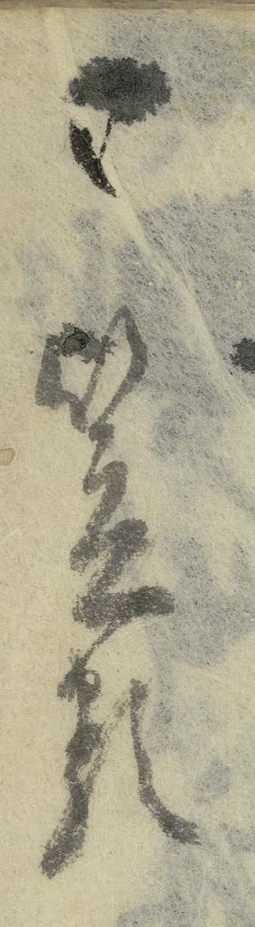一笠類

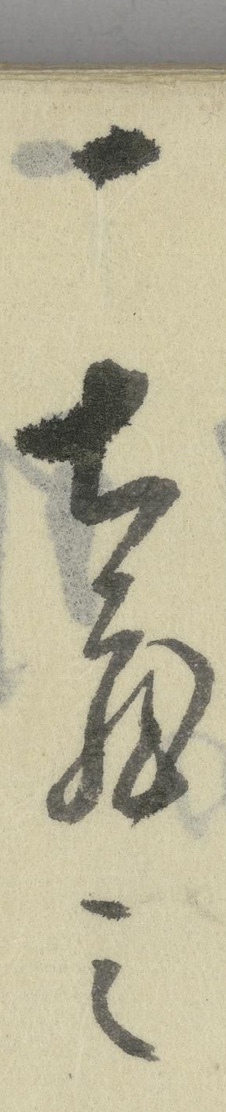一土蔵三

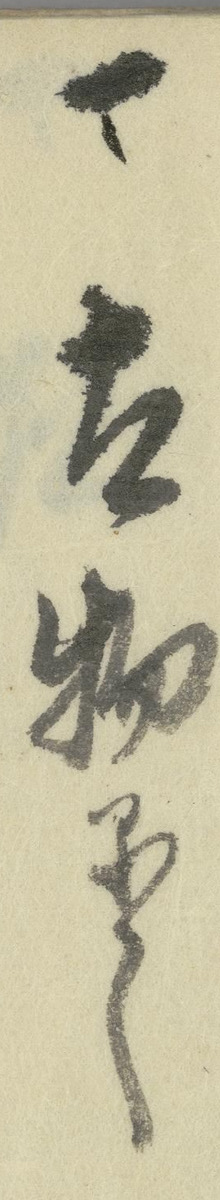一太物品々
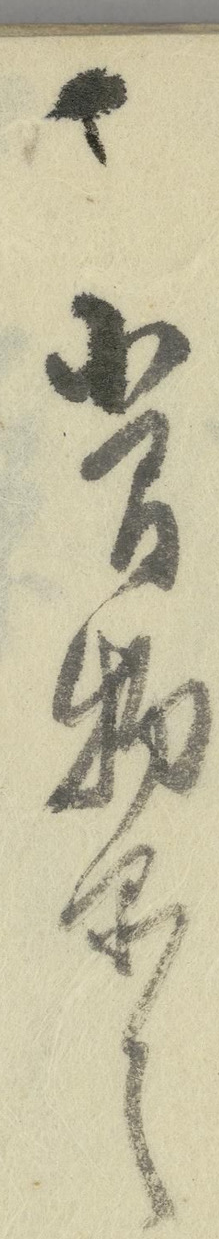一小間物品々
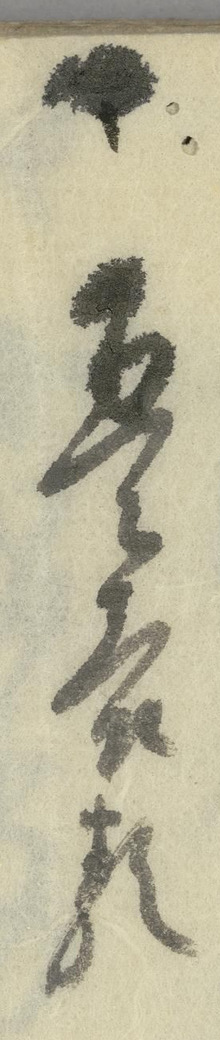一畳表類
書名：天明淺間噴火ニ関スル書類
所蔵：東京大学地震研究所図書室 Earthquake Research Institute Library, The University of Tokyo, JAPAN
